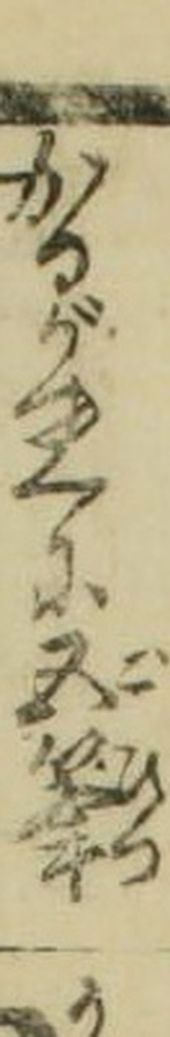かるがゆへに五筆
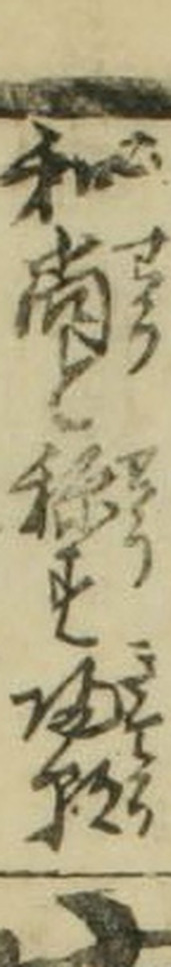和尚と称す帰朝
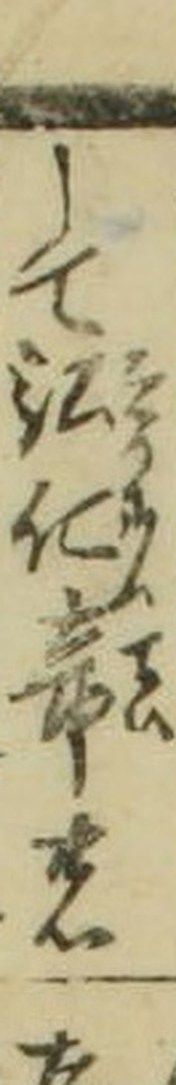して弘仁帝の
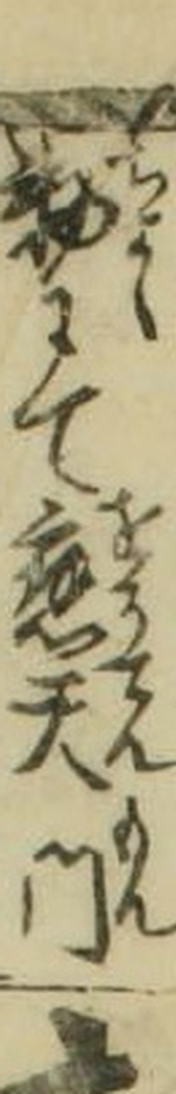勅にて應天門
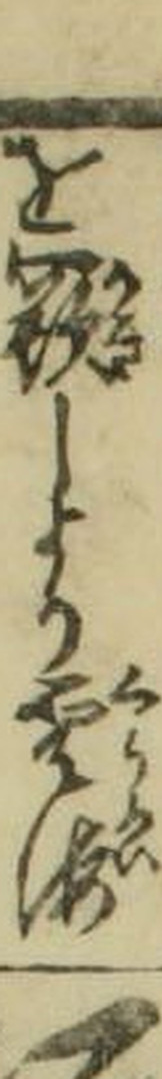を闕しより空海
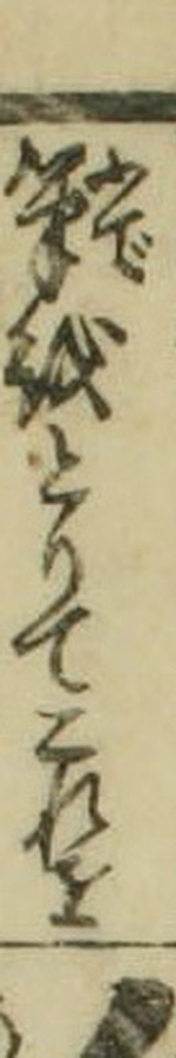茟をとりてこれを
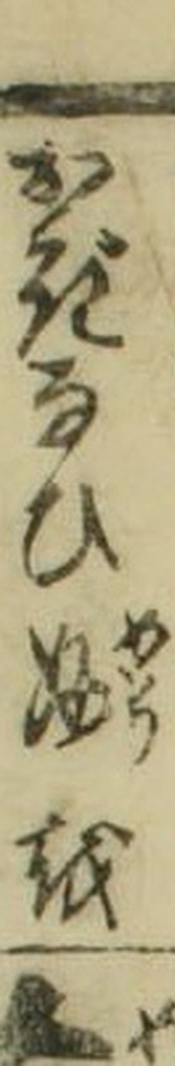おぎなひ妙を
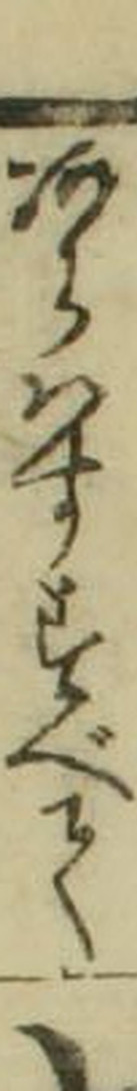あらはすすべて
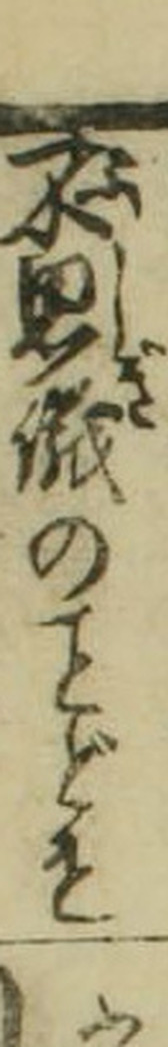不思儀のことども
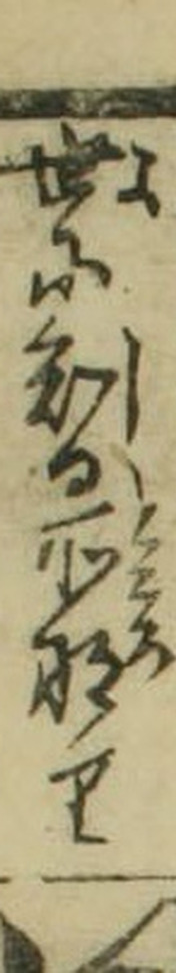世に知る所なり

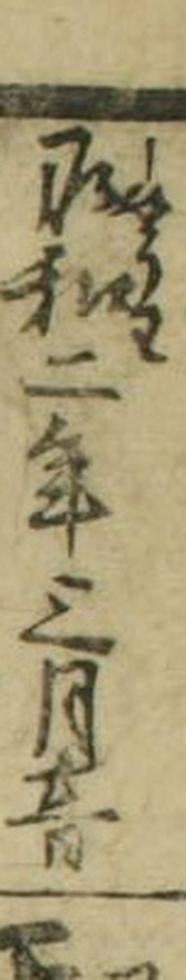承和二年三月廿一日
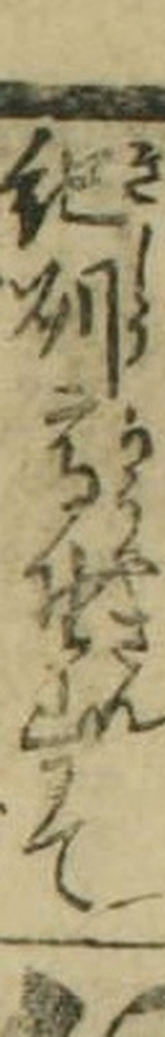紀州高野山にて
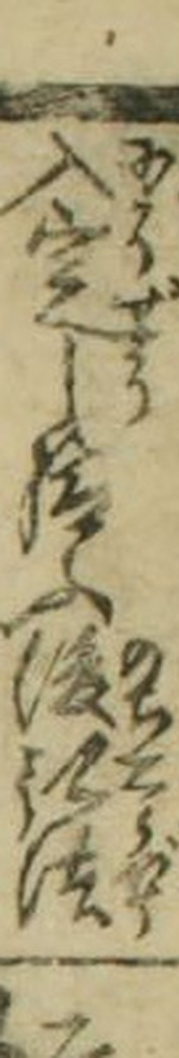入定し給ふ後弘法
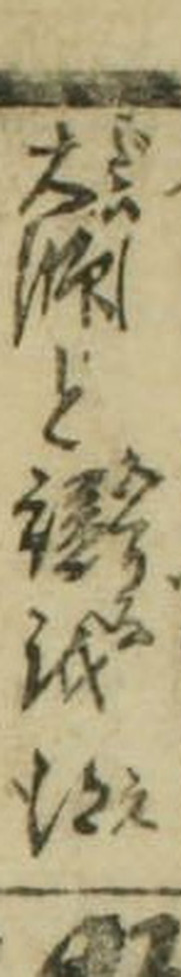大師と諡を得
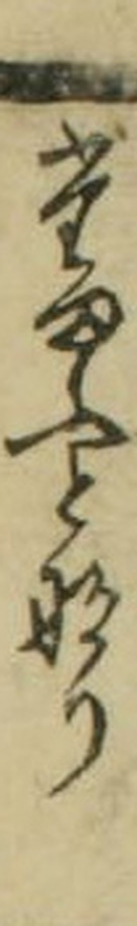たまふとなり
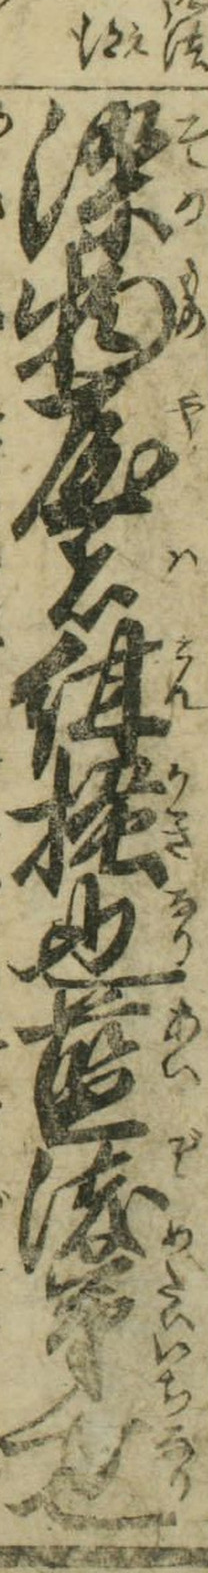染物屋者紺搔也藍染第一也
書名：増補職人往来
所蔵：東京学芸大学教育コンテンツアーカイブ
